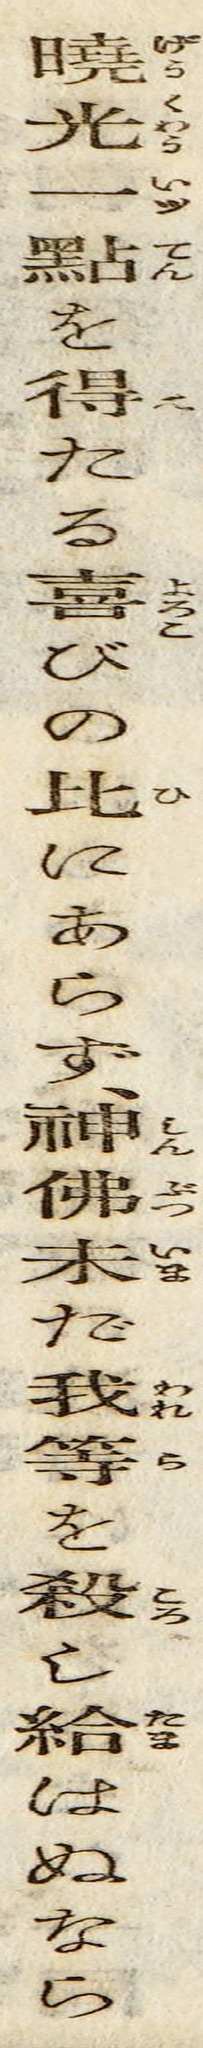暁光一点を得たる喜びの比にあらず、神仏未だ我等を殺し給はぬなら
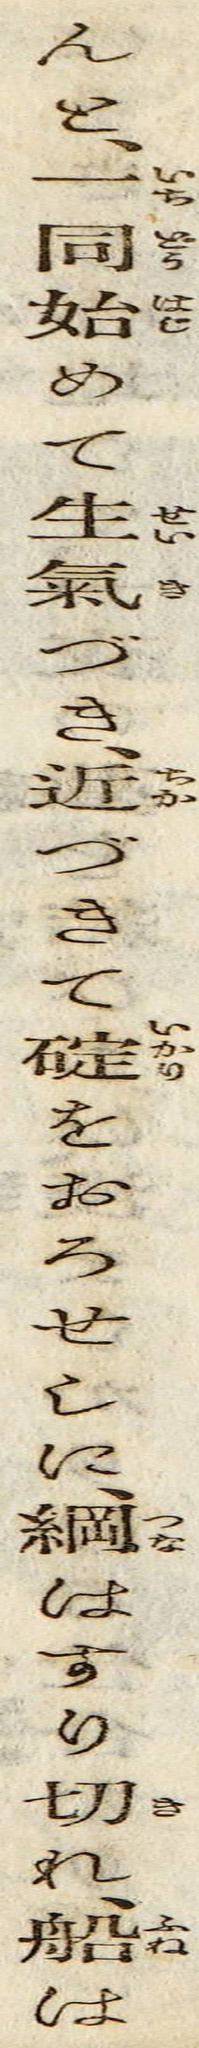んと、一同始めて生気づき、近づきて碇をおろせしに、綱はすり切れ、船は
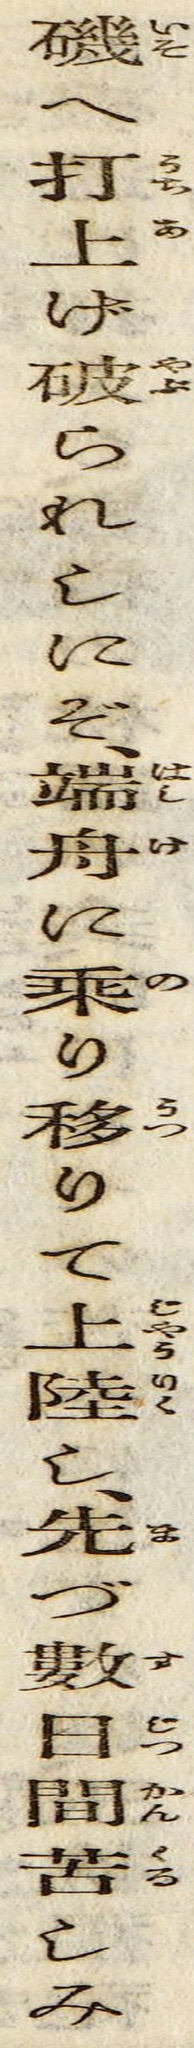磯へ打上げ破られしにぞ、端舟に乗り移りて上陸し、先づ数日間苦しみ
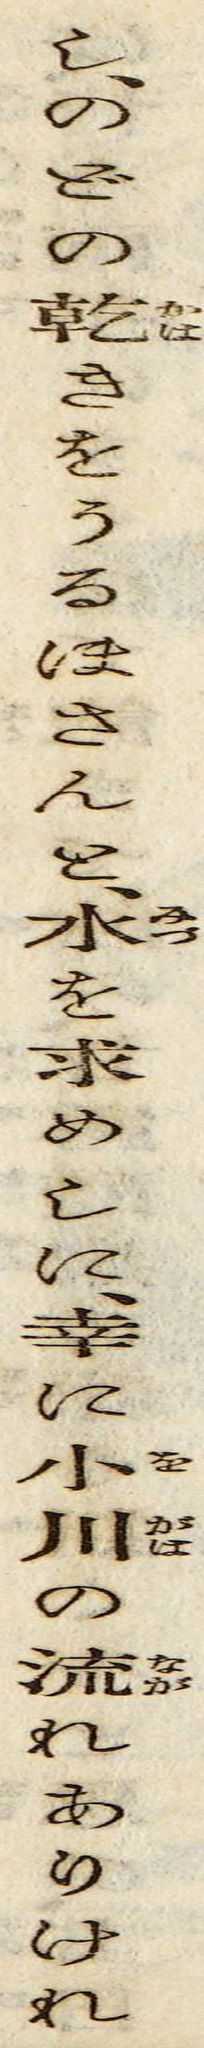し、のどの乾きをうるほさんと、水を求めしに、幸に小川の流れありけれ

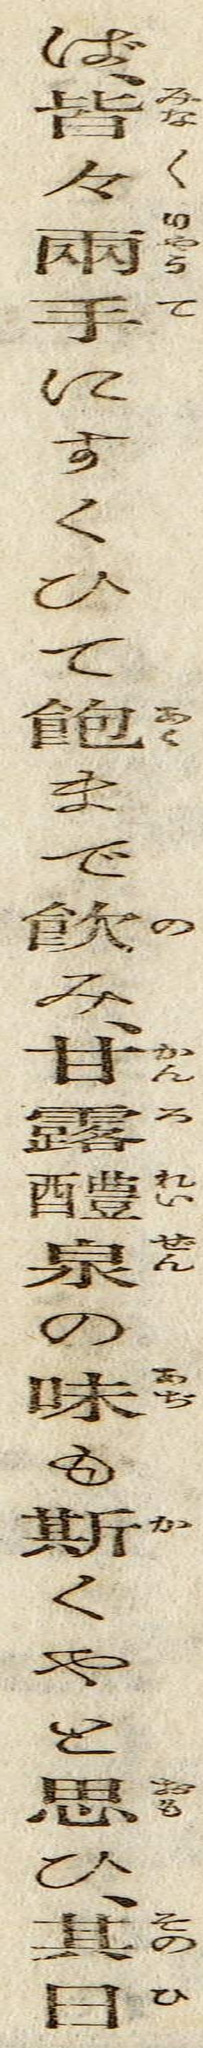ば、皆々両手にすくひて飽まで飲み、甘露醴泉の味も斯くやと思ひ、其日
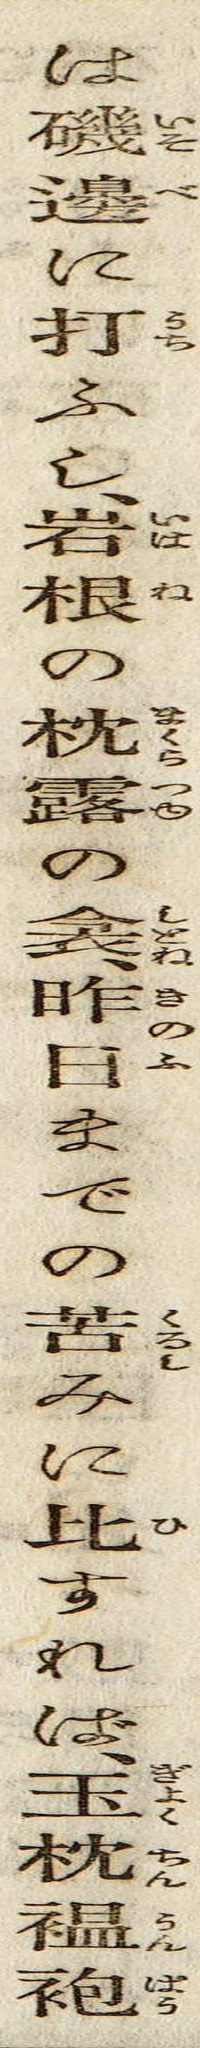は磯辺に打ふし、岩根の枕露の衾、昨日までの苦みに比すれば、玉枕褞袍
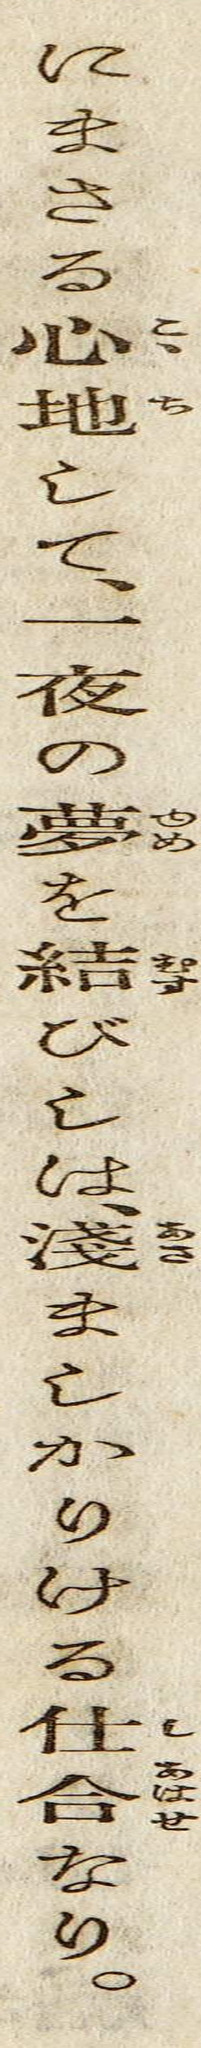にまさる心地して、一夜の夢を結びしは、浅ましかりける仕合なり。
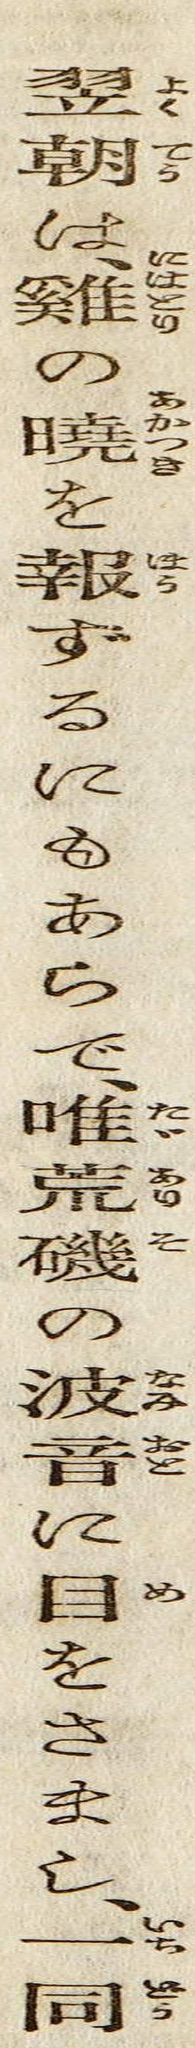翌朝は、鶏の暁を報ずるにもあらで、唯荒磯の波音に目をさまし、一同
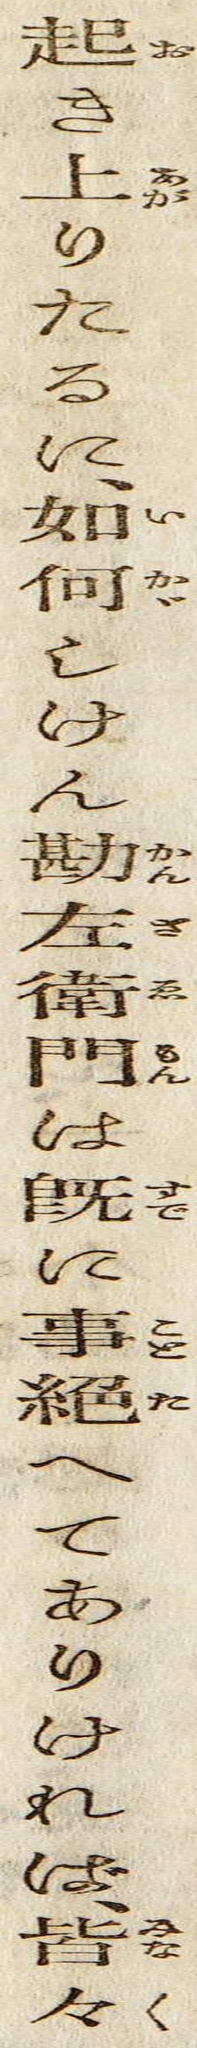起き上りたるに、如何しけん勘左衛門は既に事絶へてありければ、皆々
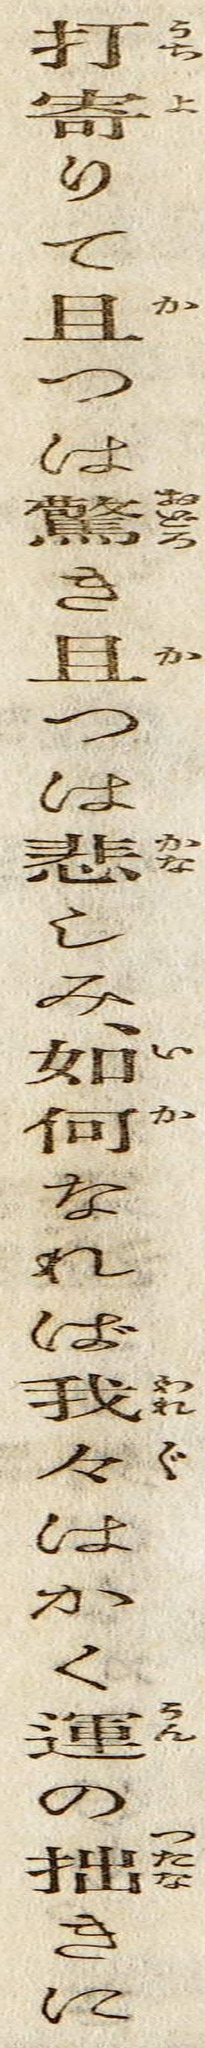打寄りて且つは驚き且つは悲しみ、如何なれば我々はかく運の拙きに
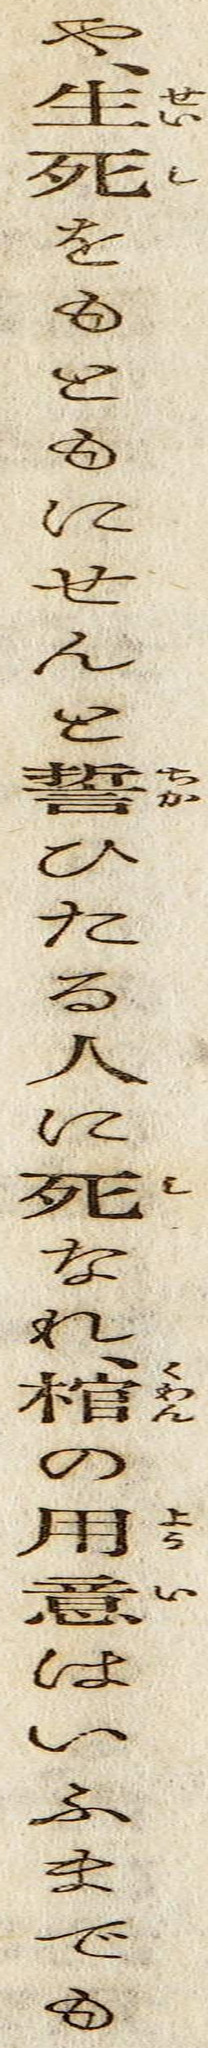や、生死をもともにせんと誓ひたる人に死なれ、棺の用意はいふまでも
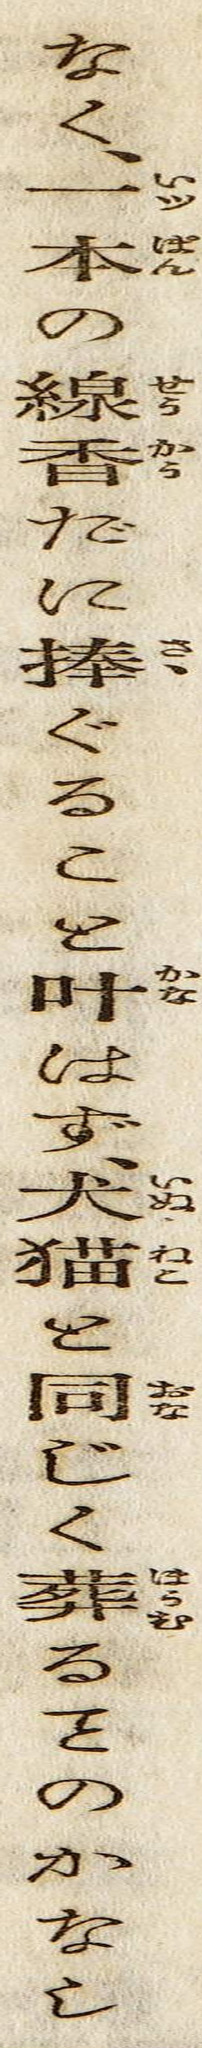なく、一本の線香だに捧ぐること叶はず、犬猫と同じく葬ることのかなし
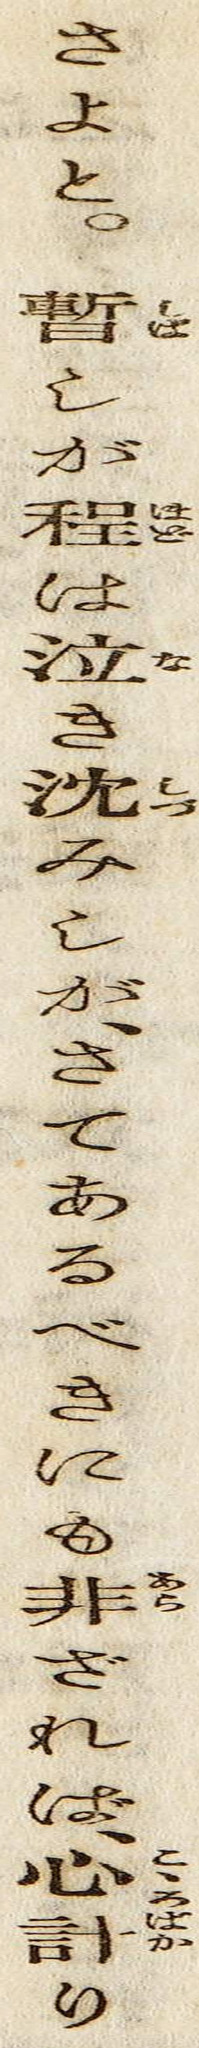さよと。暫しが程は泣き沈みしが、さてあるべきにも非ざれば、心計り
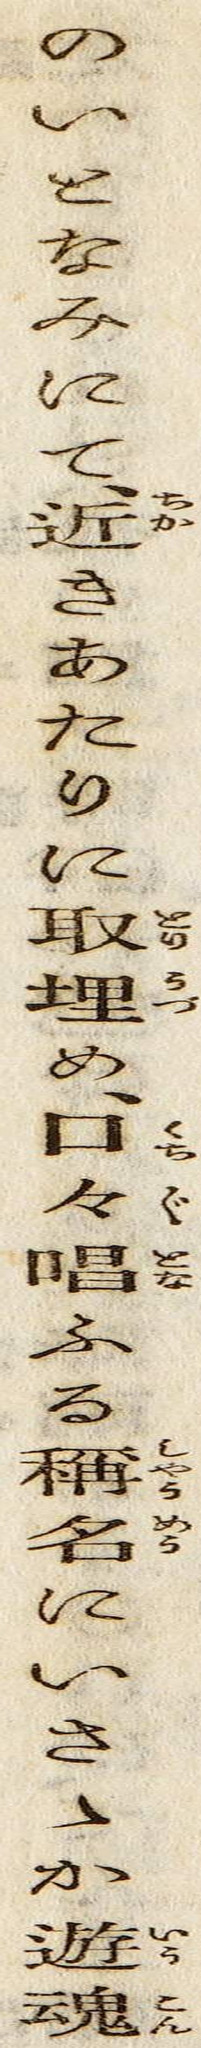のいとなみにて、近きあたりに取埋め、口々唱ふる称名にいさゝか遊魂
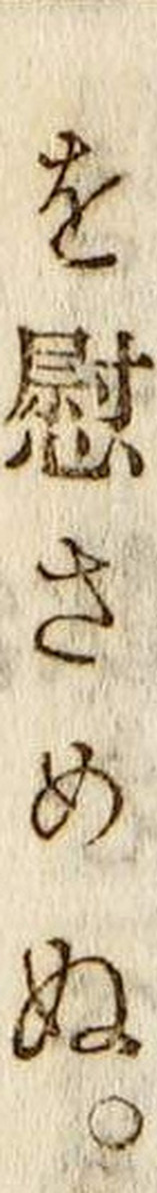を慰さめぬ。
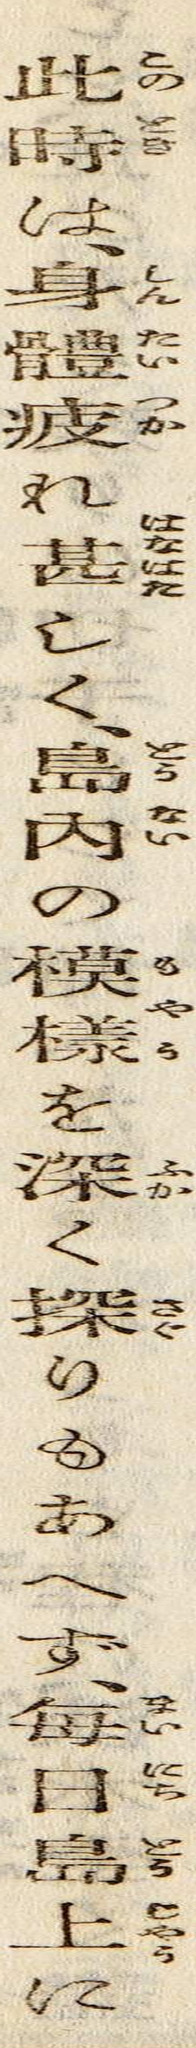此時は、身体疲れ甚しく、島内の模様を深く探りもあへず、毎日島上に
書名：日本漂流譚
